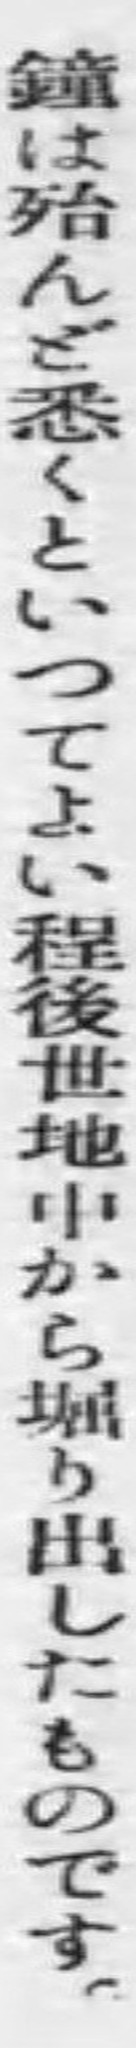鐘は殆んど悉くといつてよい程後世地中から堀り出したものです。
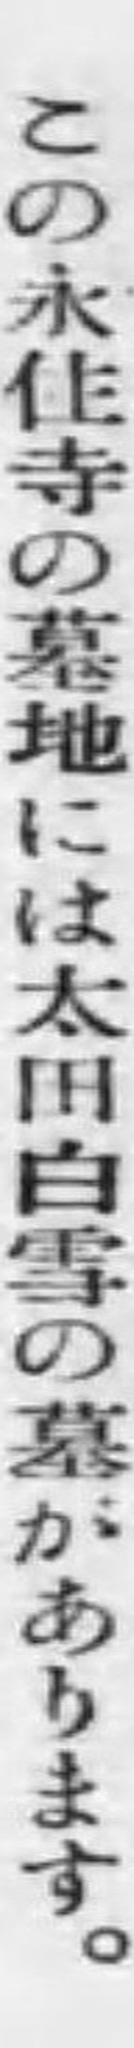この永住寺の墓地には太田白雪の墓があります。
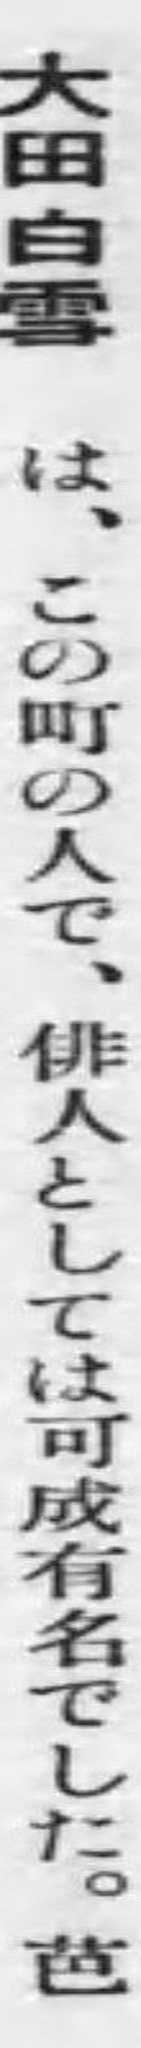大田白雪は、この町の人で、俳人としては可成有名でした。芭
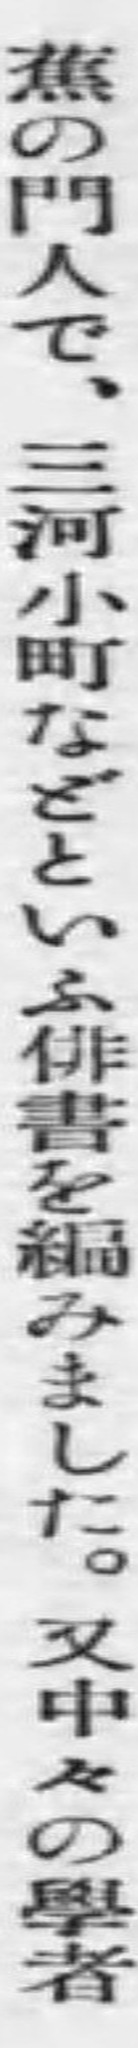蕉の門人で、三河小町などといふ俳書を編みました。又中々の学者
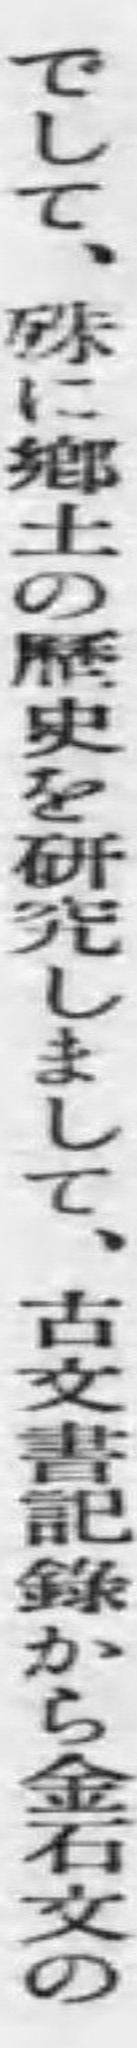でして、殊に郷土の歴史を研究しまして、古文書記録から金石文の
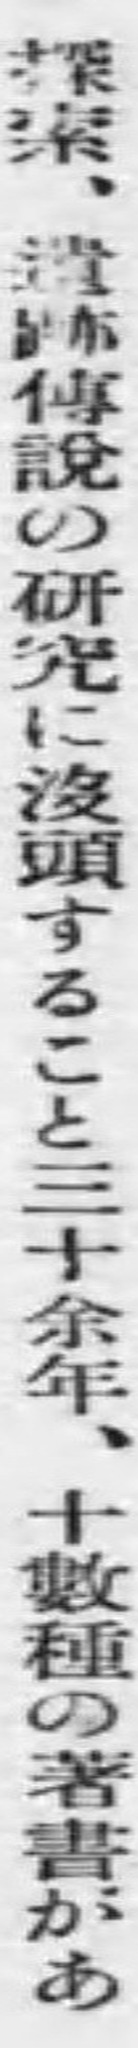探索、遺跡伝説の研究に没頭すること三十余年、十数種の著書があ
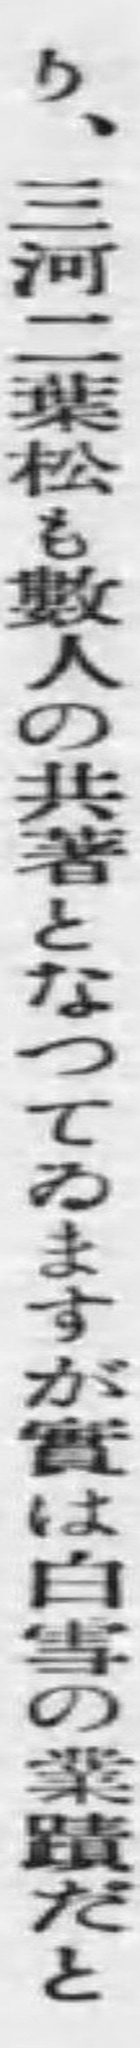り、三河二葉松も数人の共著となつてゐますが実は白雪の業蹟だと
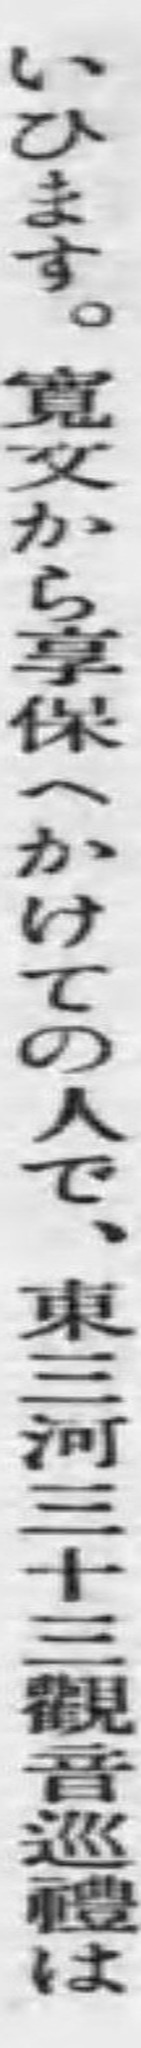いひます。寛文から享保へかけての人で、東三河三十三観音巡礼は
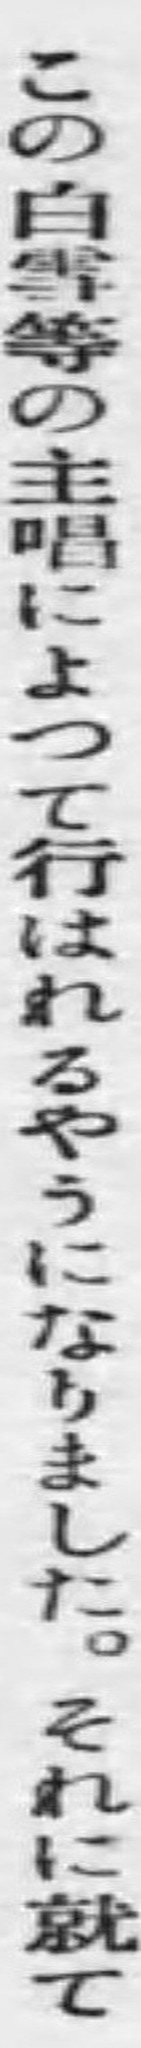この白雪等の主唱によつて行はれるやうになりました。それに就て
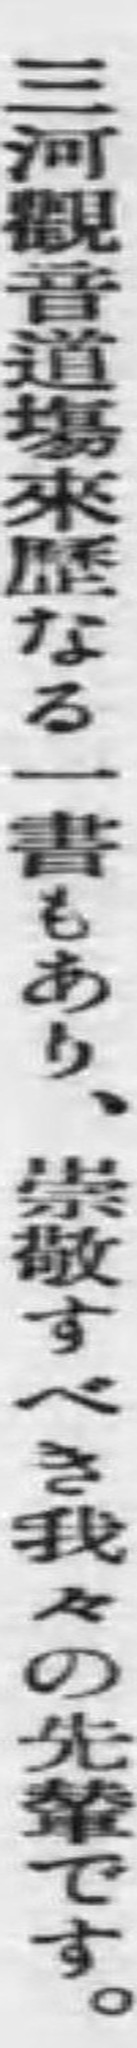三河観音道場来歴なる一書もあり、崇敬すべき我々の先輩です。
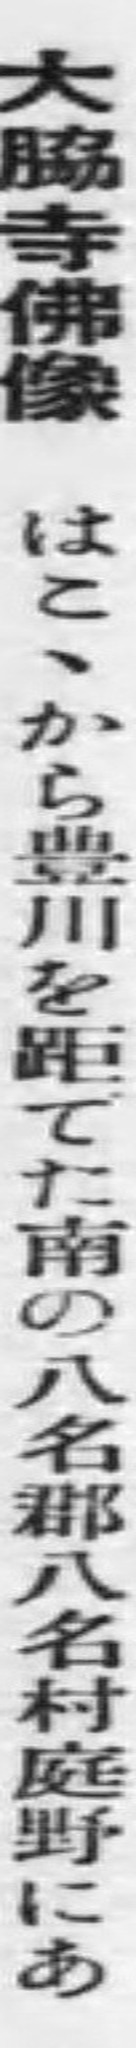大脇寺仏像はこゝから豊川を距てた南の八名郡八名村庭野にあ
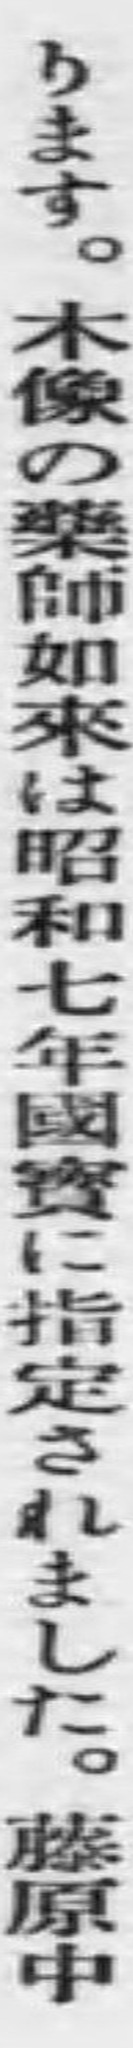ります。木像の薬師如来は昭和七年国宝に指定されました。藤原中
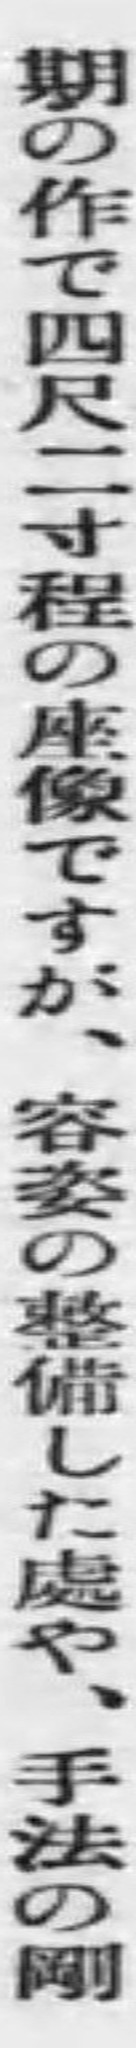期の作で四尺二寸程の座像ですが、容姿の整備した処や、手法の剛
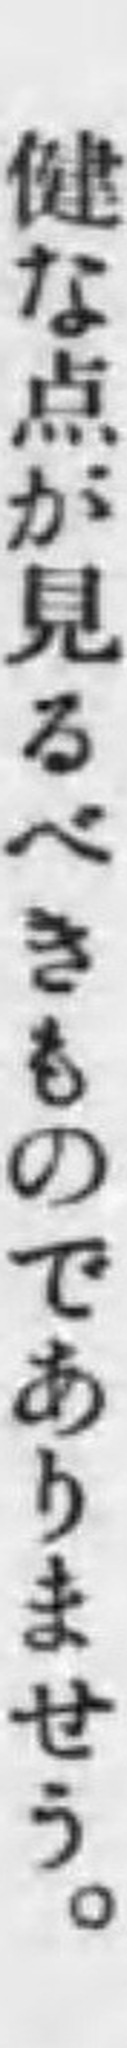健な点が見るべきものでありませう。
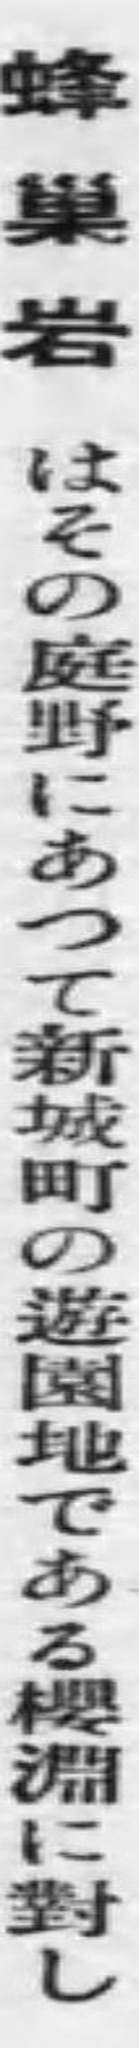蜂巣岩はその庭野にあつて新城町の遊園地である桜淵に対し
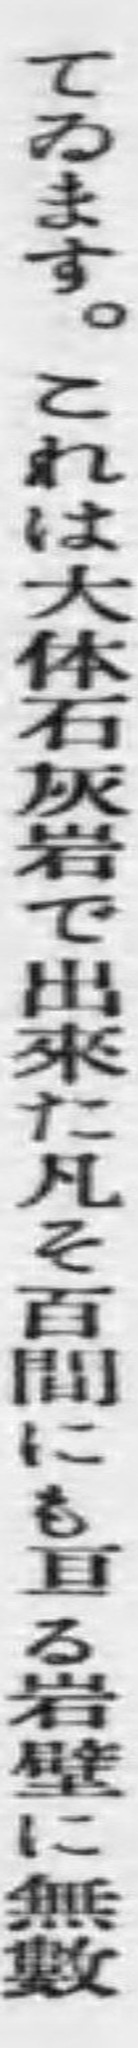てゐます。これは大体石灰岩で出来た凡そ百間にも亘る岩壁に無数
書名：東三河道中記 : 豊橋市及其附近案内
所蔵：国立国会図書館 National Diet Library, JAPAN
